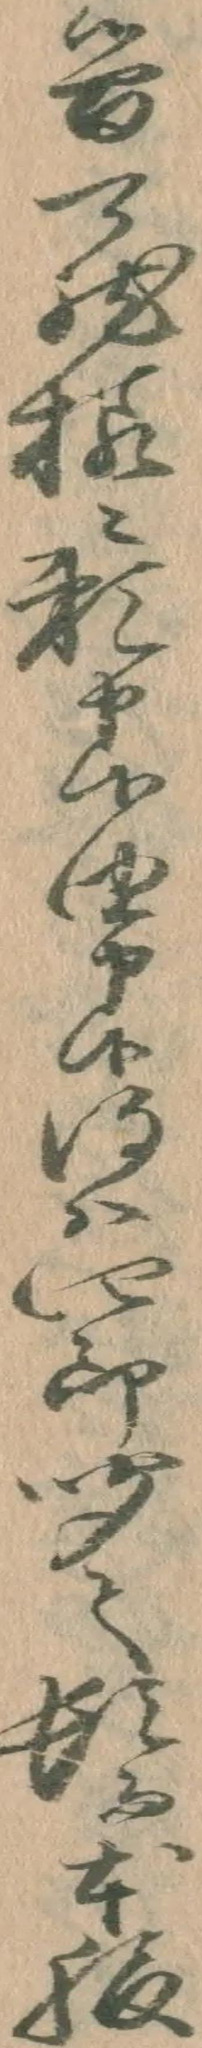候間可然様に頼申候申候得は四郎聞て頓而本復
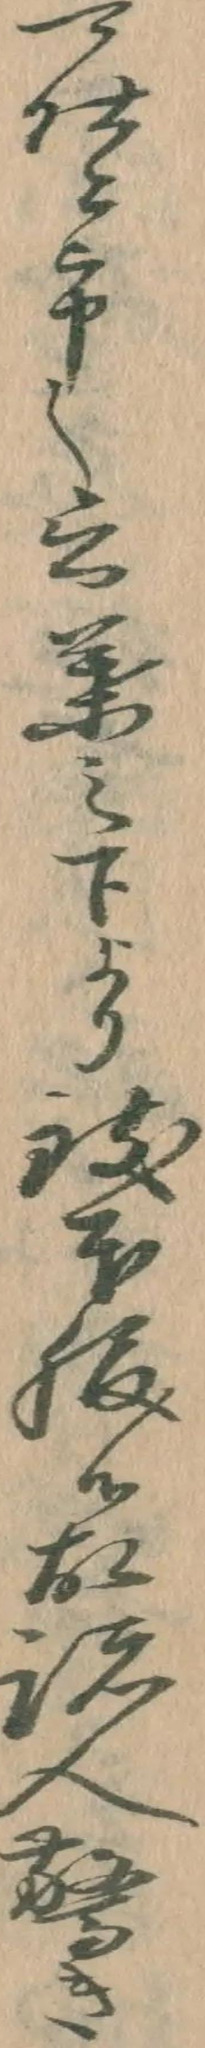可仕と被申候云気之下より致本復候故諸人驚き
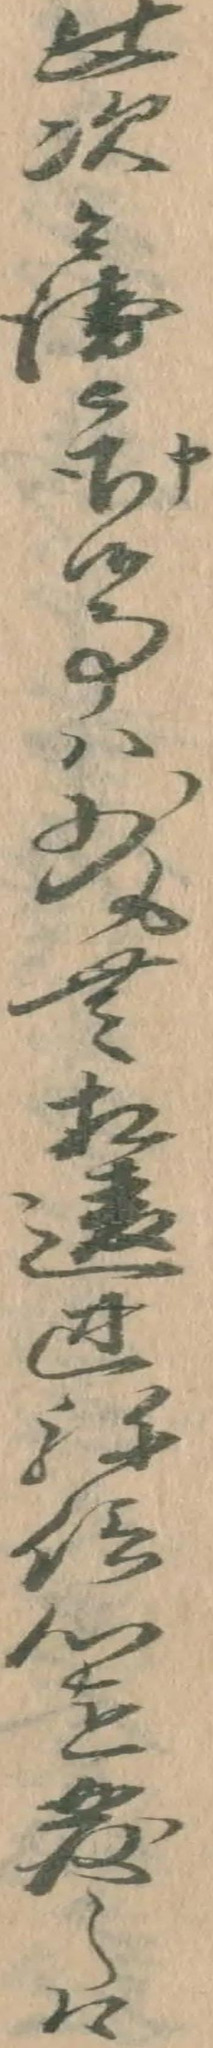此次兵衛被下候事は少も相違迚弥信心を発しけ
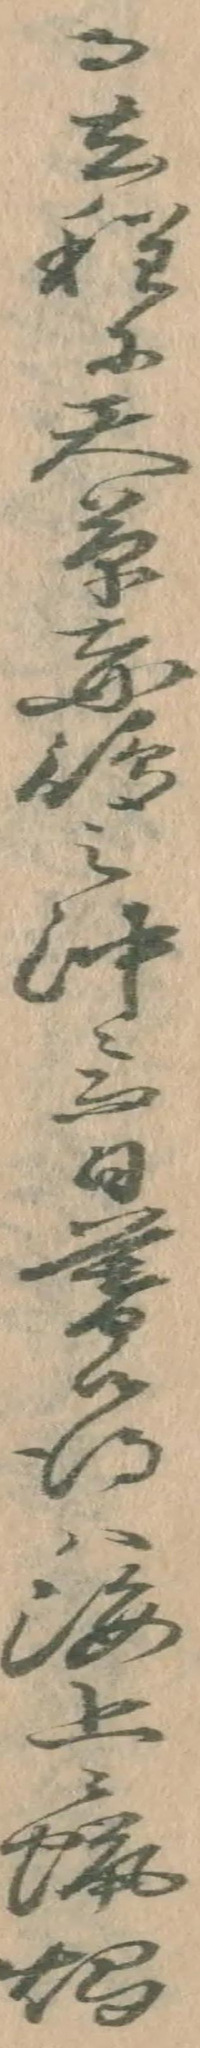る去程に天草赤島之沖に而日暮候得は海上に蝋燭
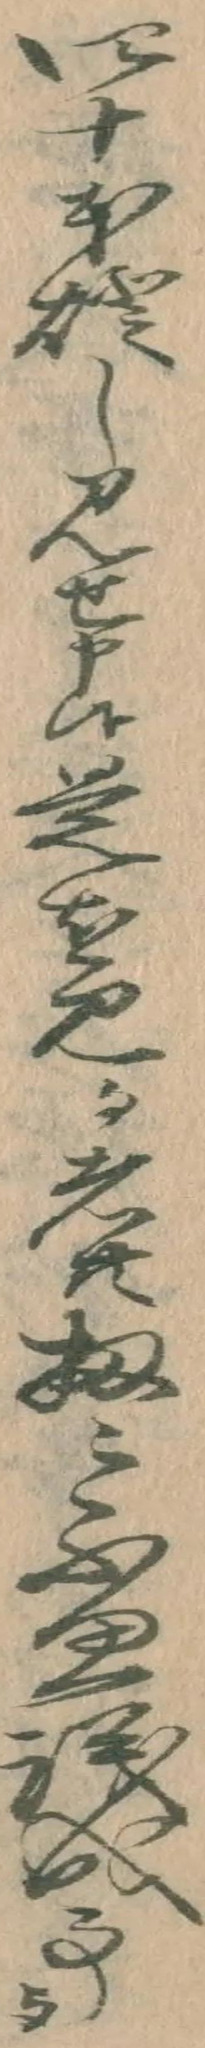四十本灯し見せ申候是を見る者共扨々不思議成事与
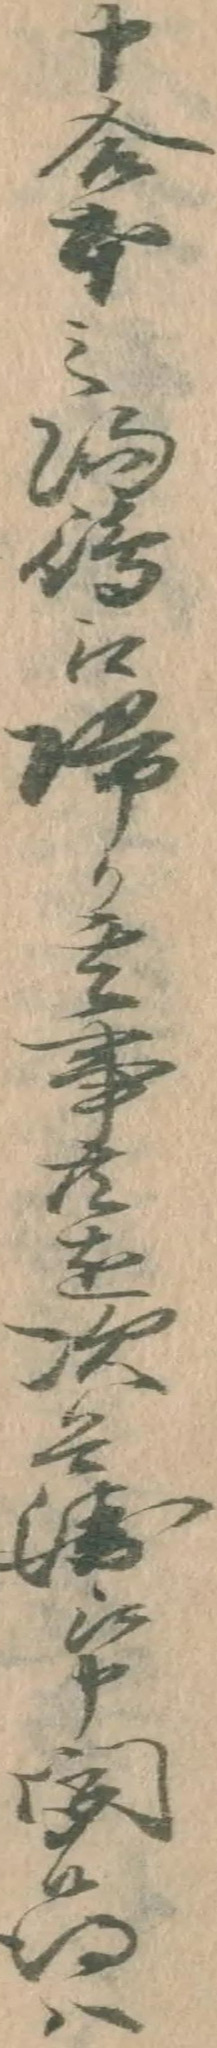申合本之湯島え帰り其事共を次兵衛え申聞候得は
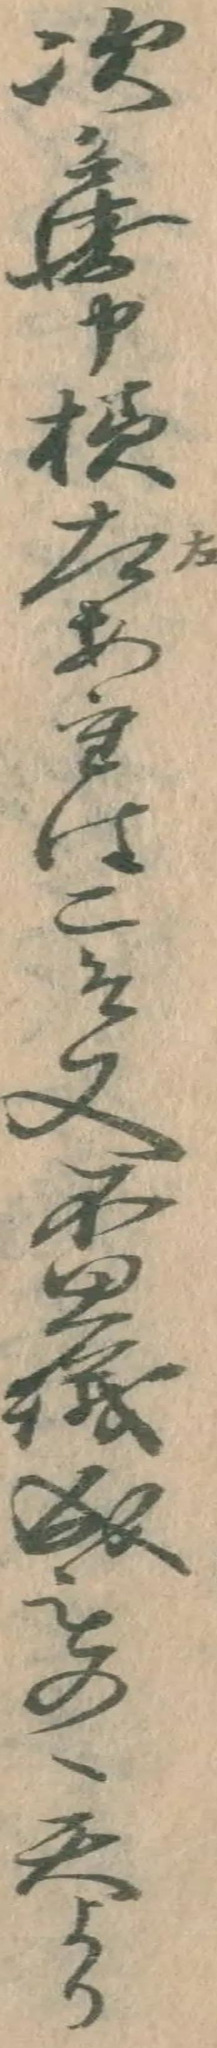次兵衛申様さあれはこそ又不思議成ものゝ天より
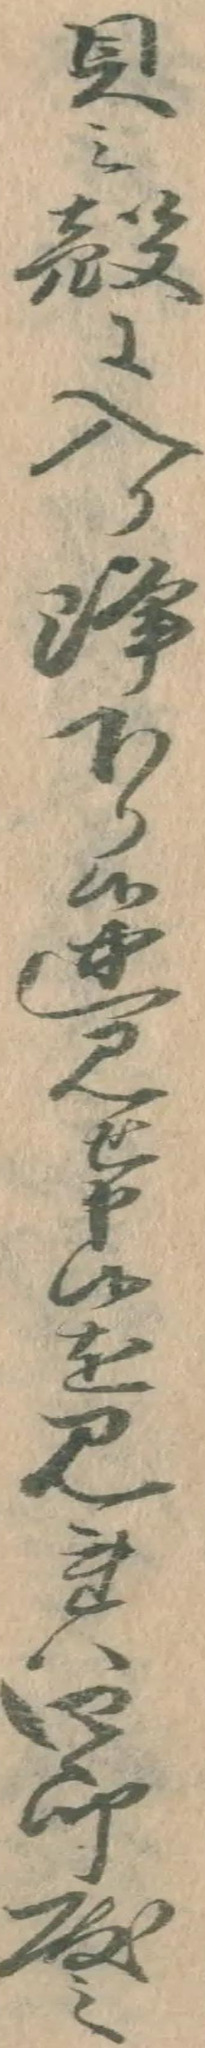貝之殻に入り降下り候迚見せ申候を見れは四郎殿之
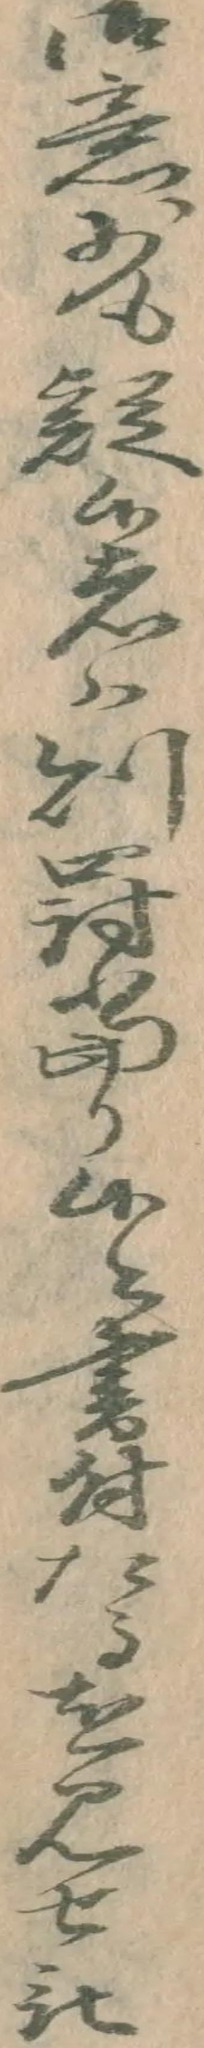御意少も疑候者は則罰当り候と書付たるを見せ被
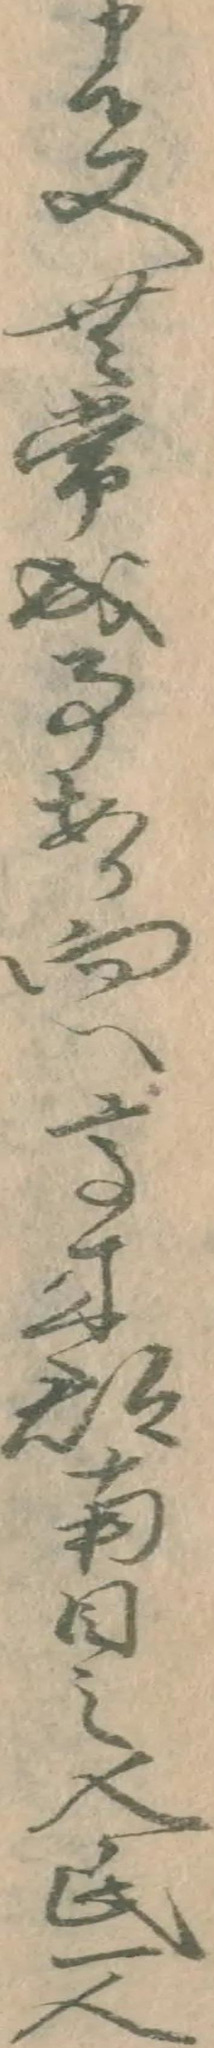申候又無常成事あり向へ高来郡南目之人民一人
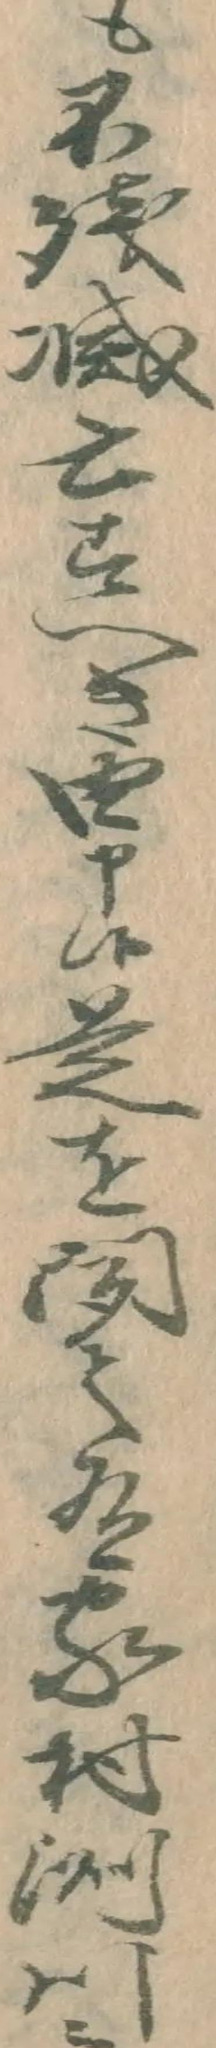も不残滅亡すへき由申候是を聞て有家村洲川に

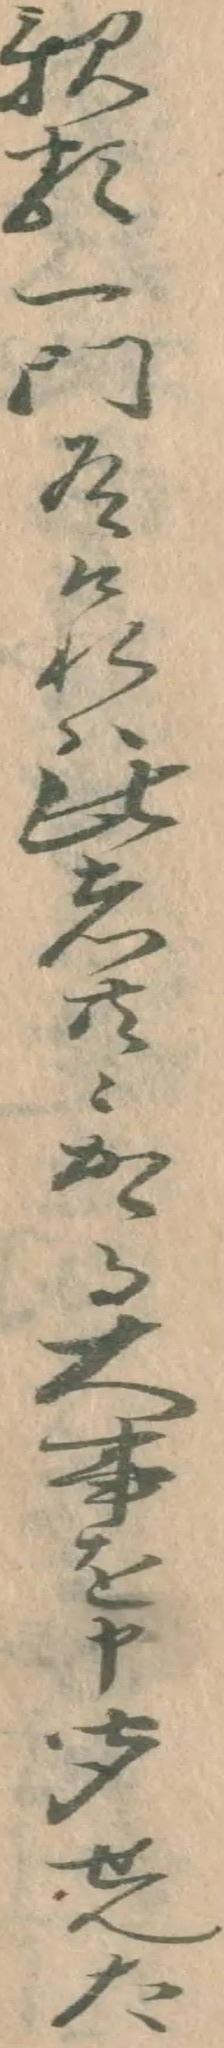親類一門有けれは此者共にかゝる大事を申聞せんた
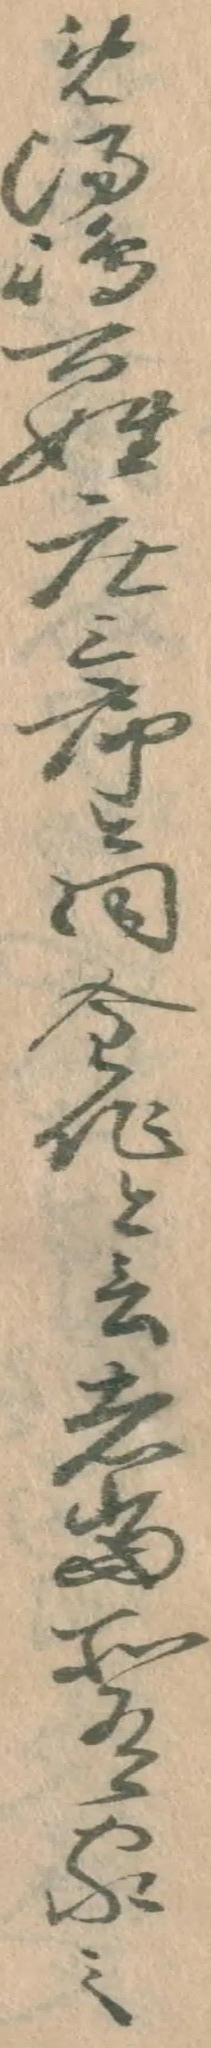め湯島百姓庄三郎と同金作と云者当所有家之
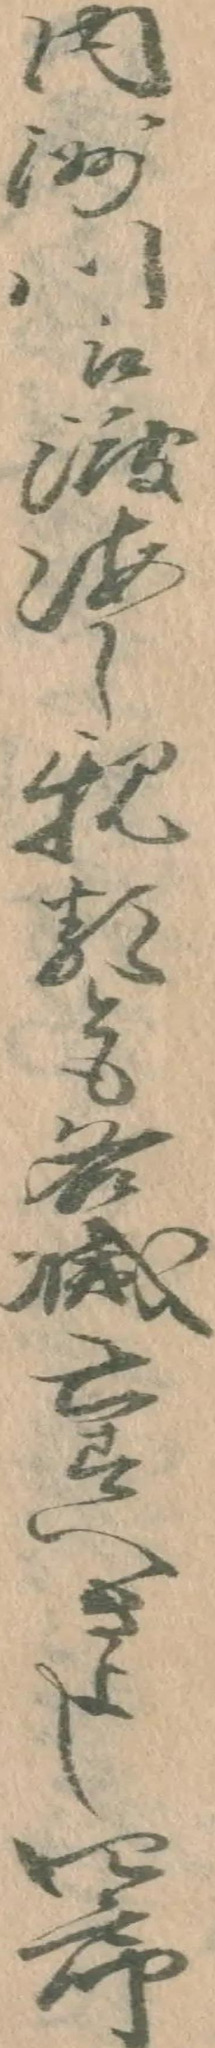内洲川え渡海し親類とも各滅亡すへきよし四郎
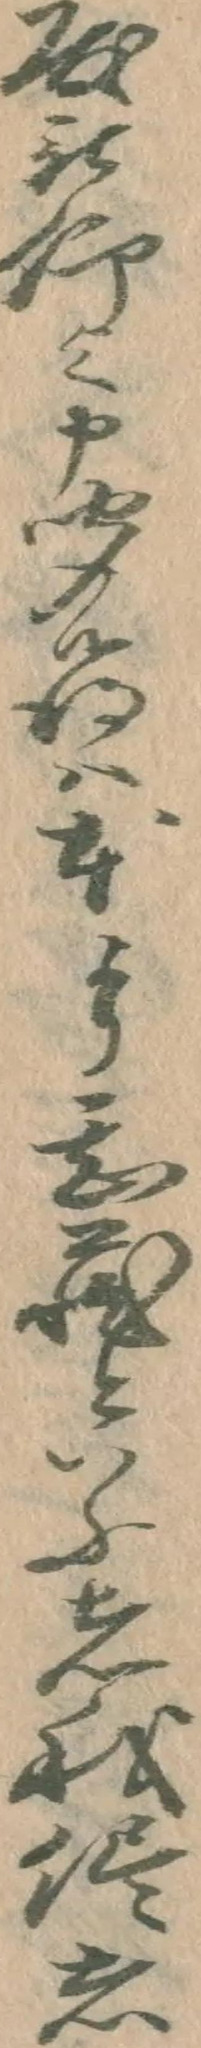殿被仰与申聞候得は本より甚蔵といふ者我儘者
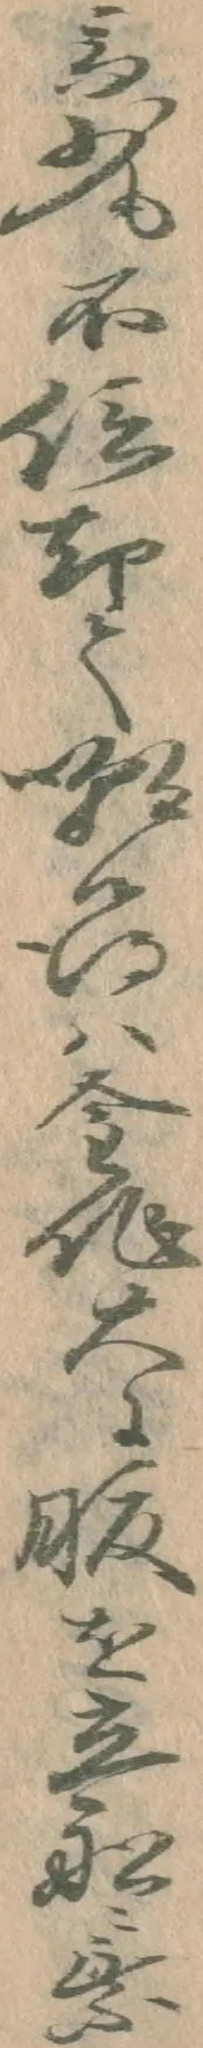に而少も不信却て嘲候得は金作大に腹を立船に乗
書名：切支丹御退治記 49巻. [1]
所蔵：国立国会図書館 National Diet Library, JAPAN
